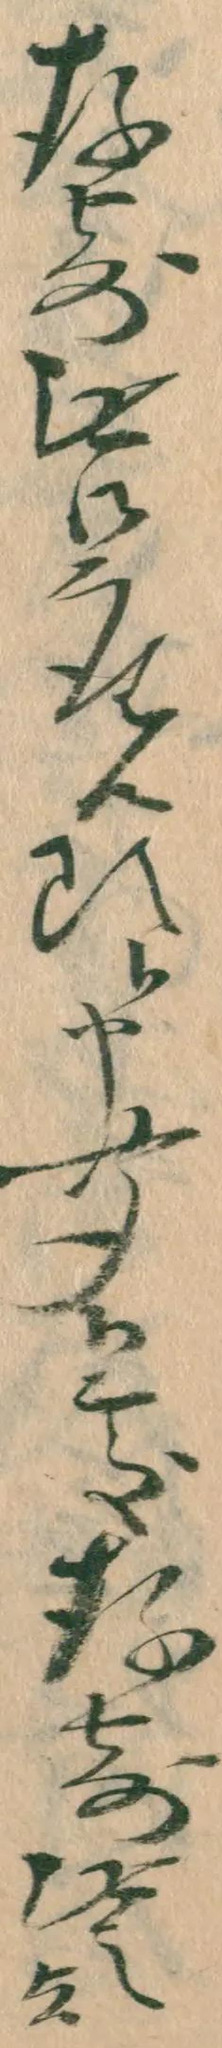存寄無御座候頭え申聞候処存寄無之旨
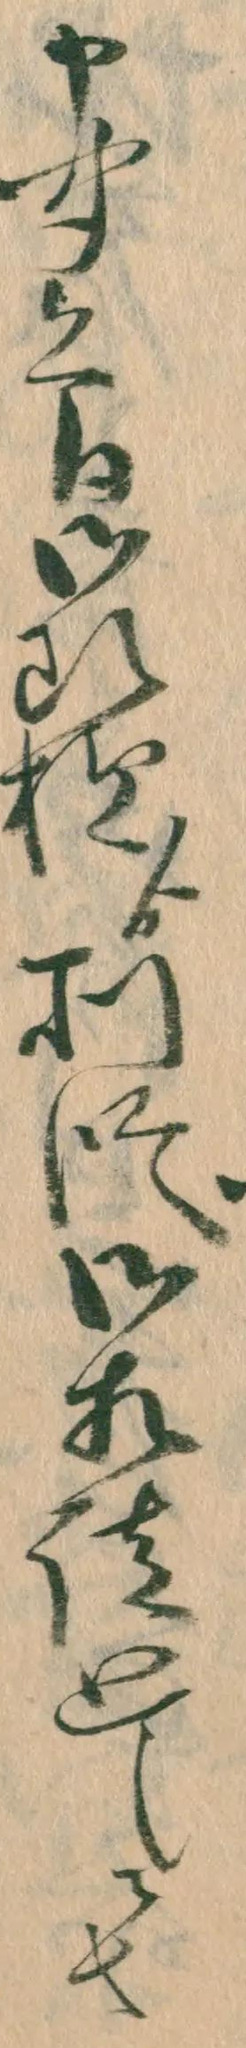申聞候間御頭様ゟ別段御相談廻しニは
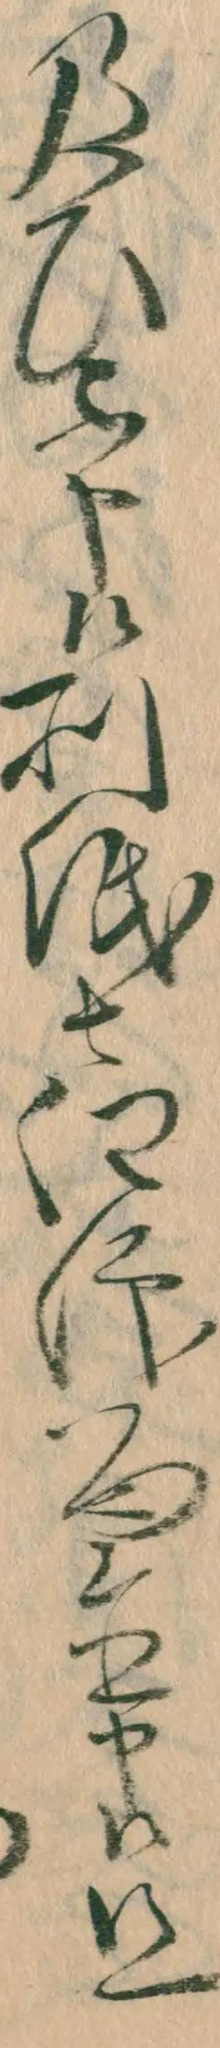及ひ不申候別紙は任仰留置申候且
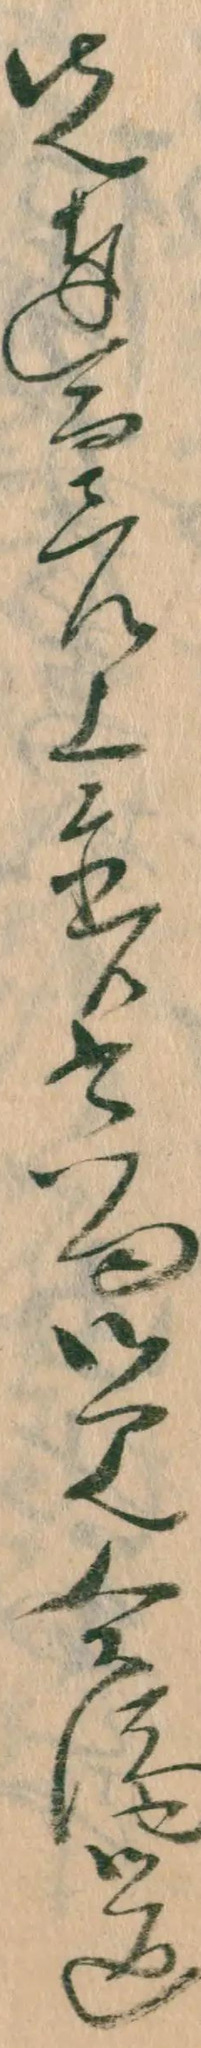先達て差し上置候書留御見合後御返
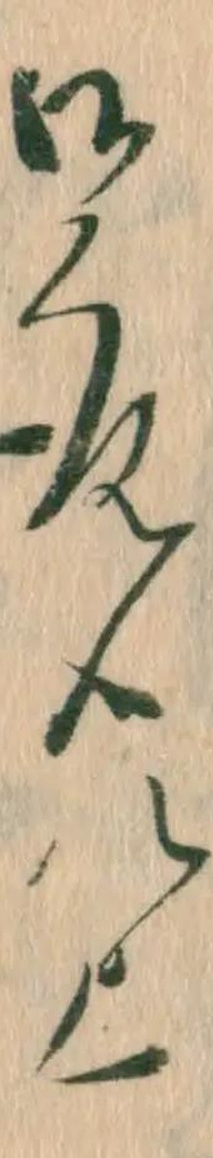御座候以上
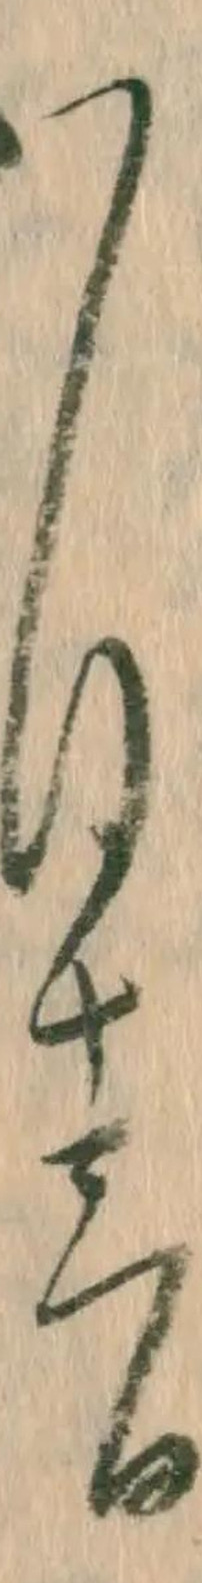八月十三日
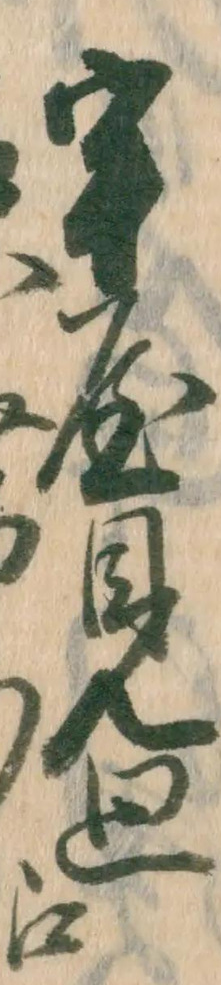│牢屋見廻
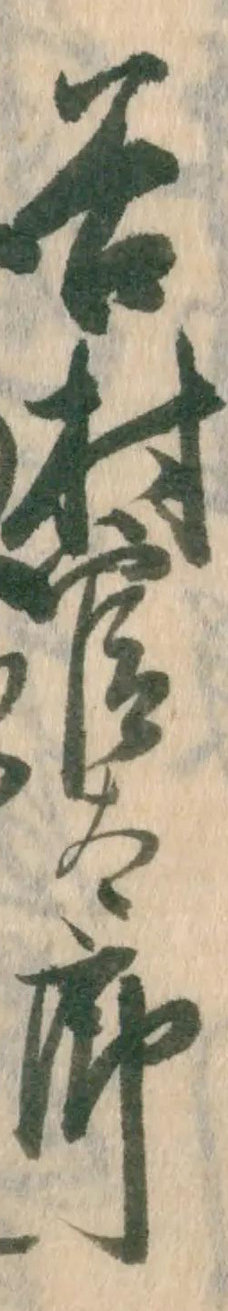谷村官太郎
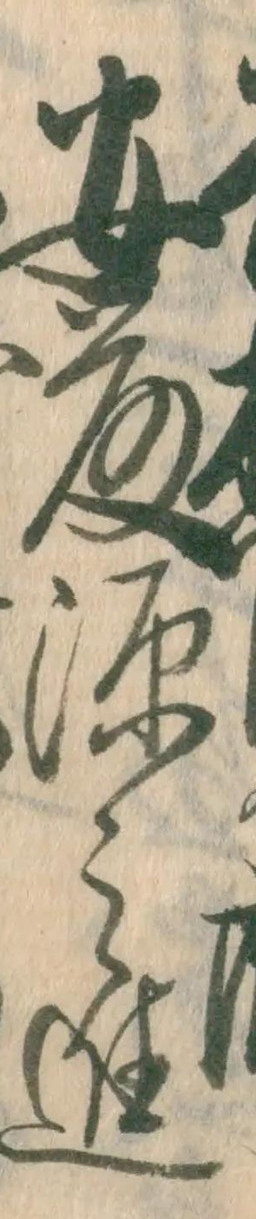安藤源之進
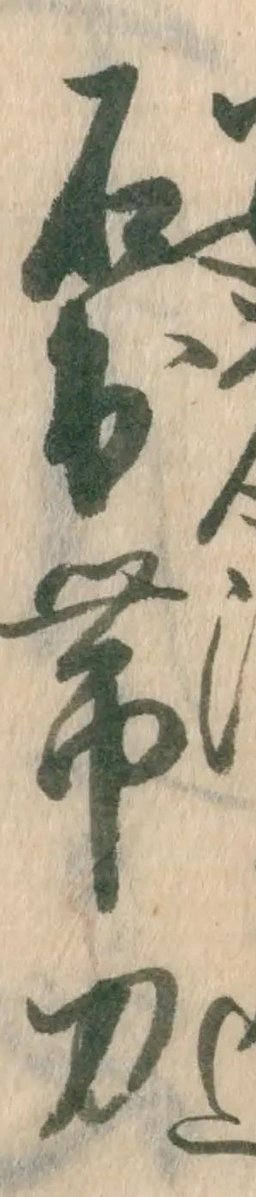石出帯刀

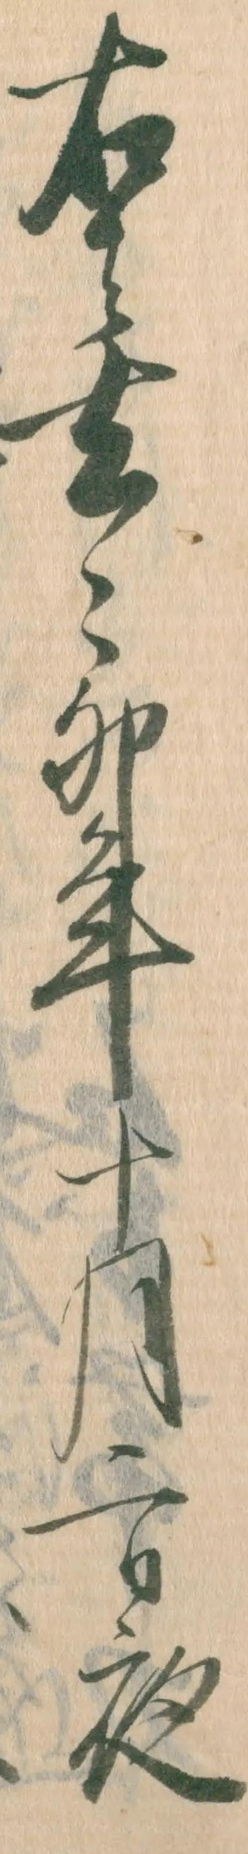右は去〻卯年十月二日夜
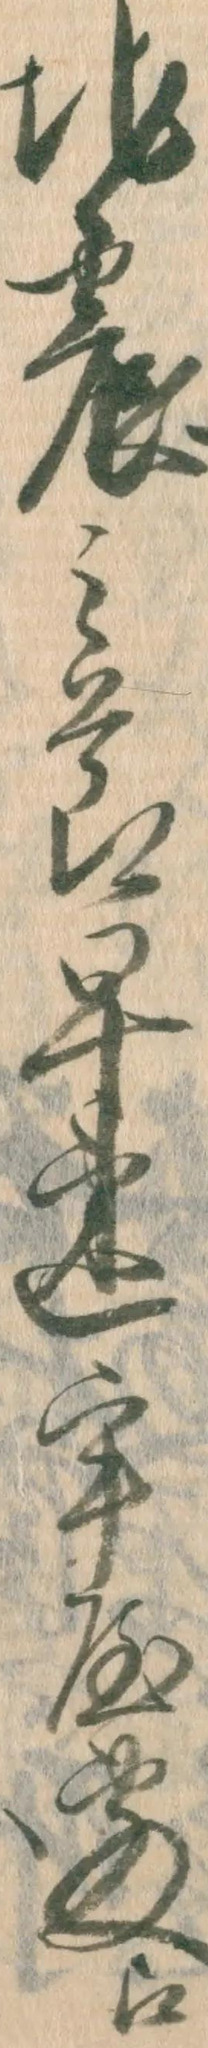地震之節早速牢屋敷え
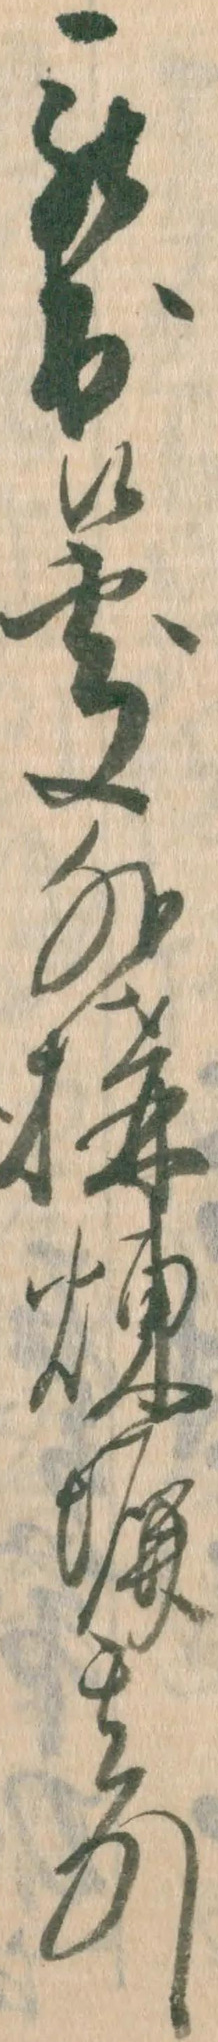罷出候処外構煉塀其外
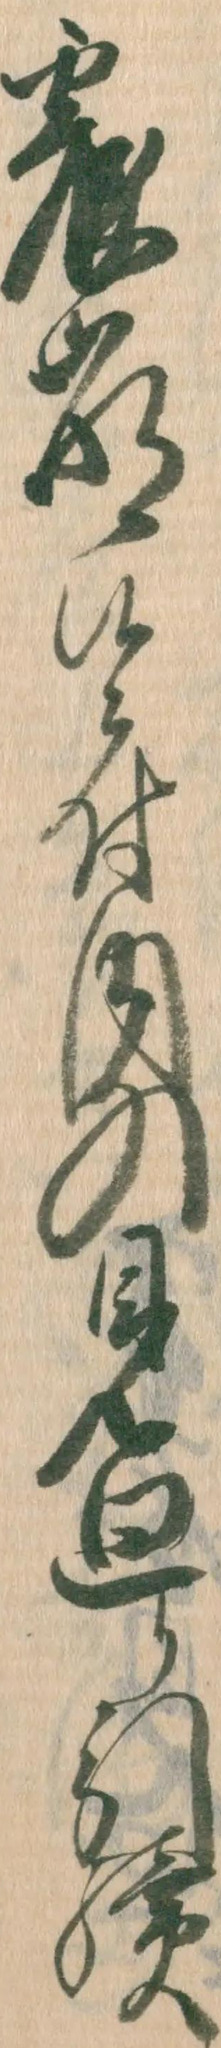震崩候ニ付内外見廻り引続
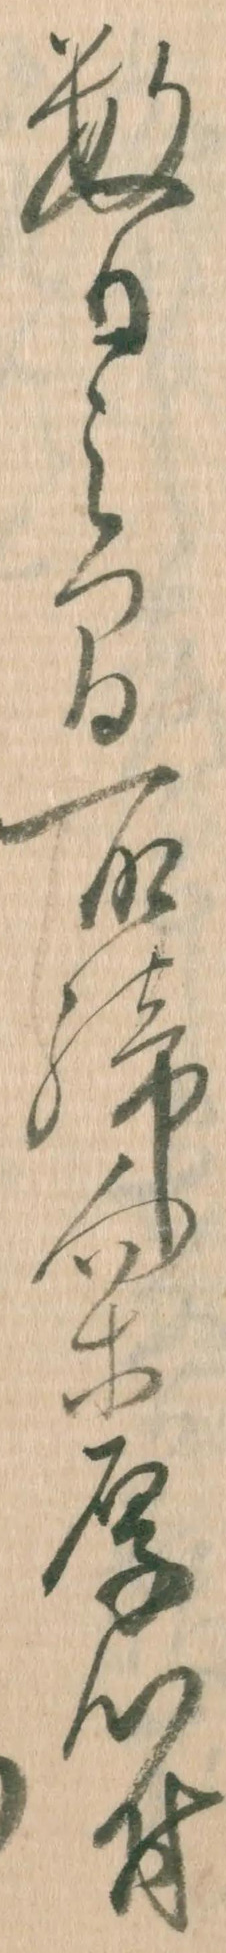数日之間取締向等厚心付
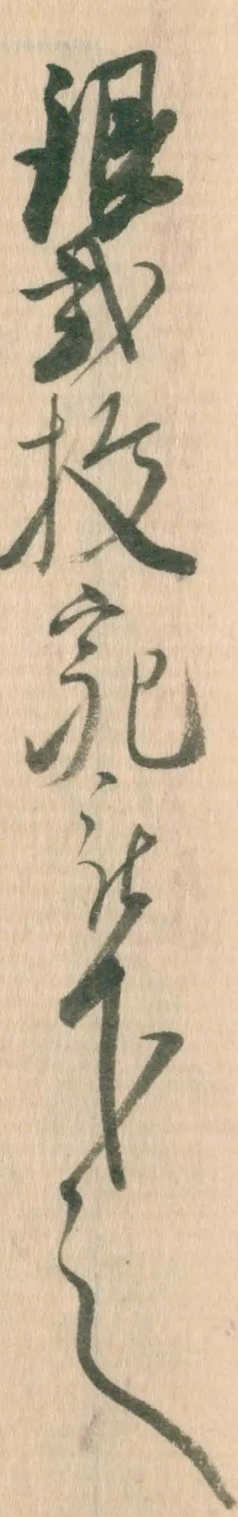銀弐枚宛被下之
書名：七十冊物類集 71巻. [44] 四十三 牢屋敷御普請御修覆地震ニ付骨折候牢屋掛御褒美之部
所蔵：国立国会図書館 National Diet Library, JAPAN
